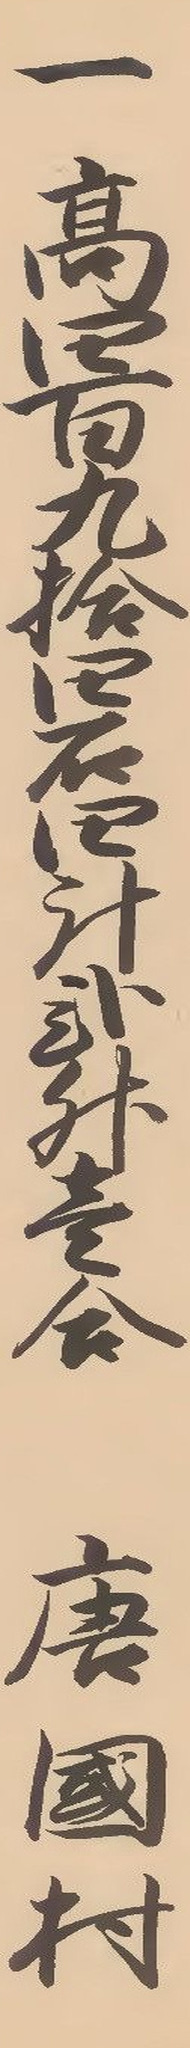一高四百九拾四石四斗弐升壱合唐国村
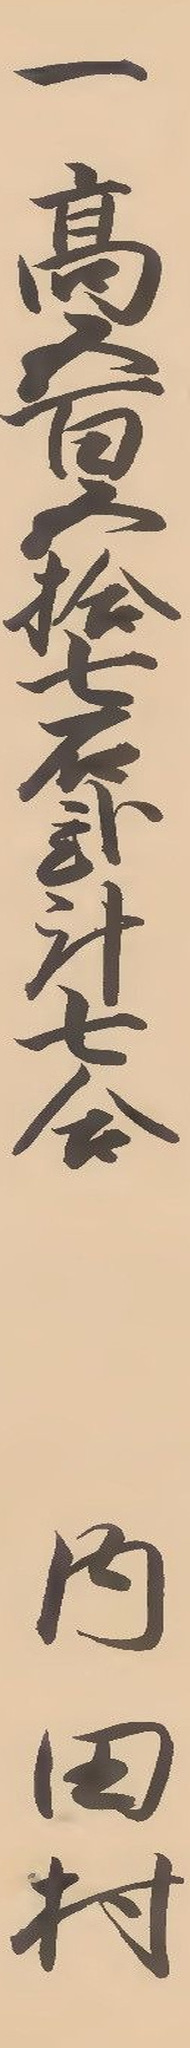一高五百五拾七石弐斗七合内田村
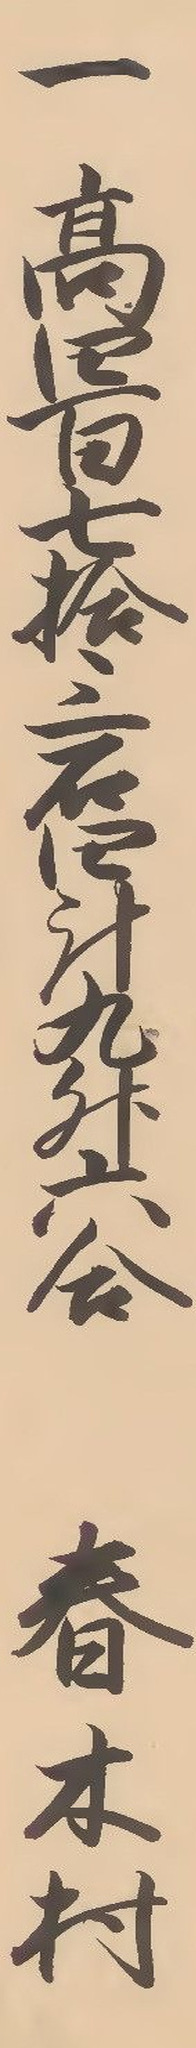一高四百七拾三石四斗九升六合春木村

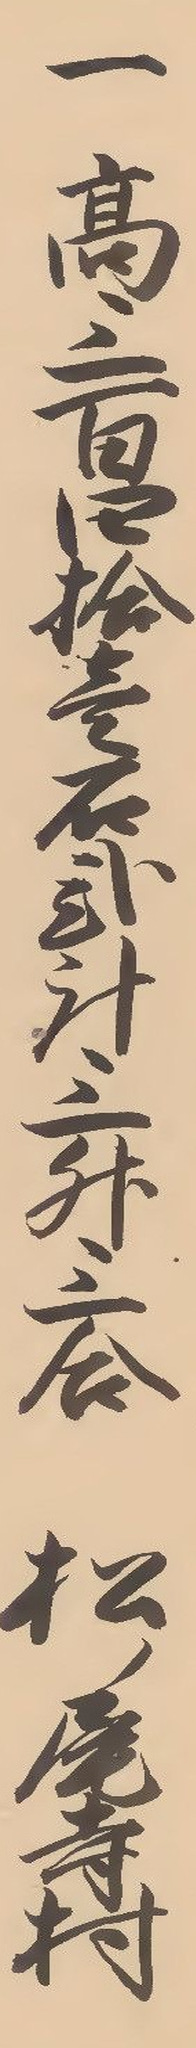一高三百四拾壱石弐斗三升三合松ノ尾寺村
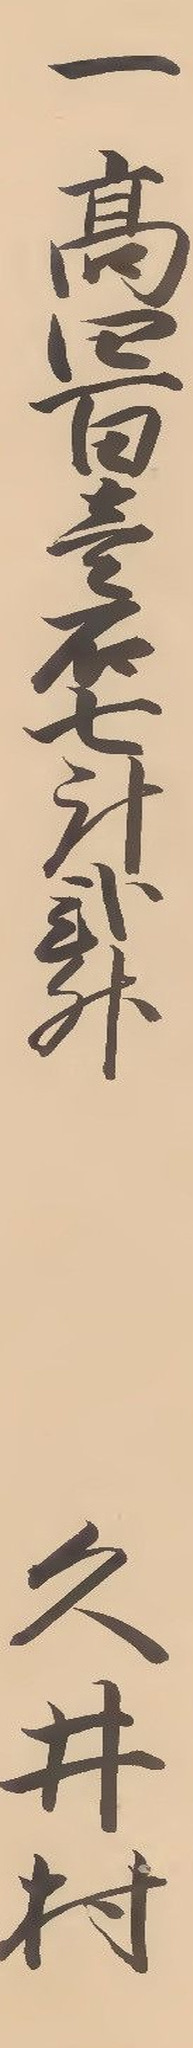一高四百壱石七斗弐升久井村
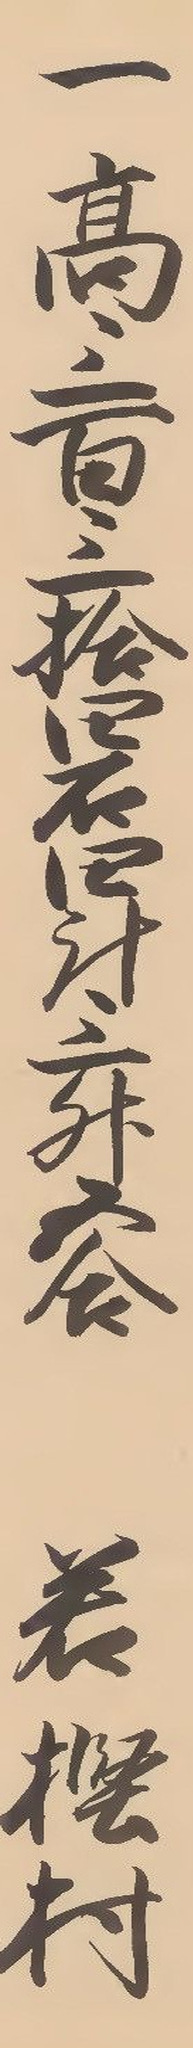一高三百三拾四石四斗三升五合若樫村
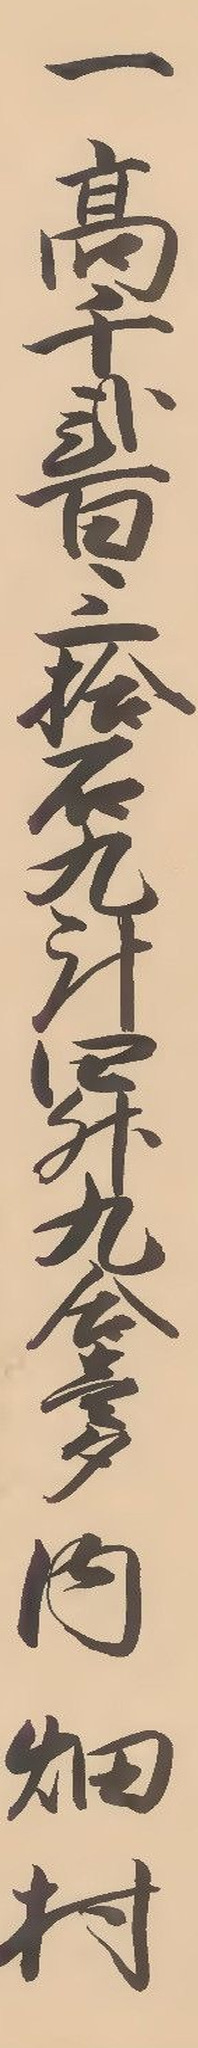一高千弐百三拾石九斗四升九合壱勺内畑村
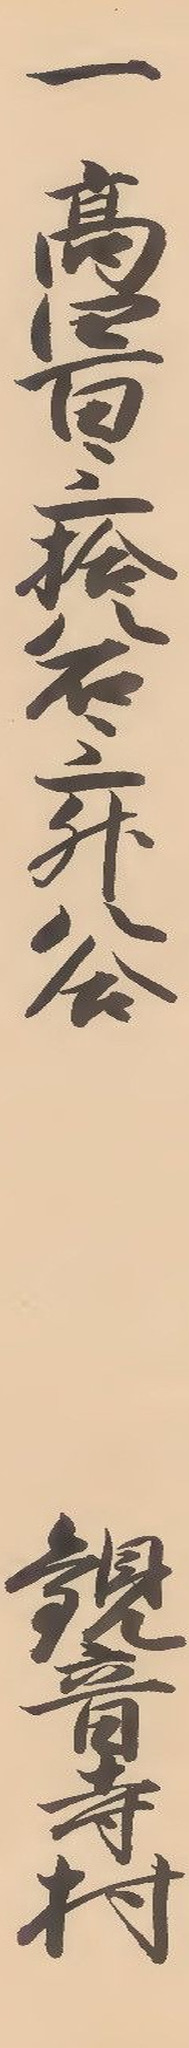一高四百三拾八石三升八合観音寺村
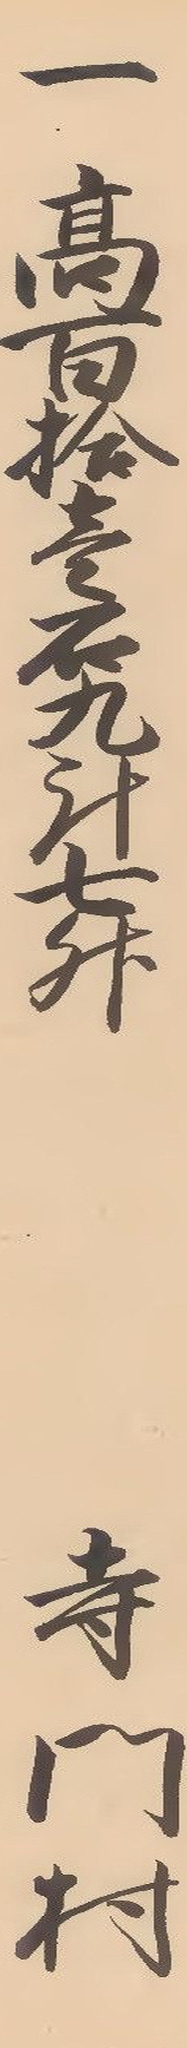一高百拾壱石九斗七升寺門村
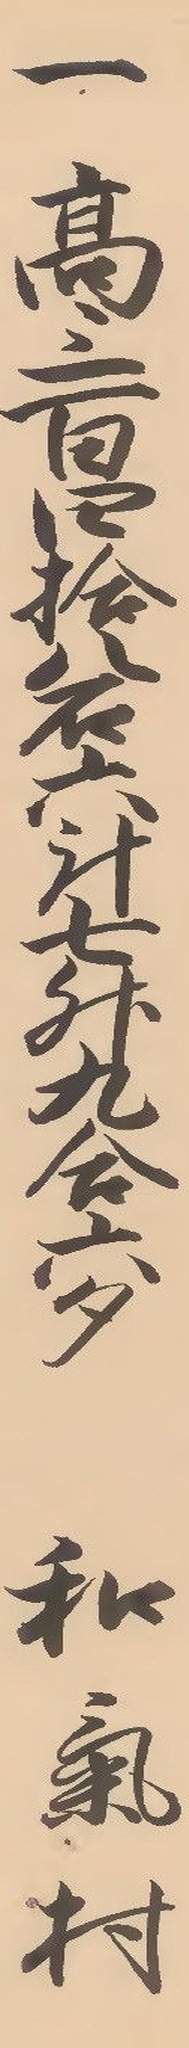一高三百四拾八石六斗七升九合六勺和気村
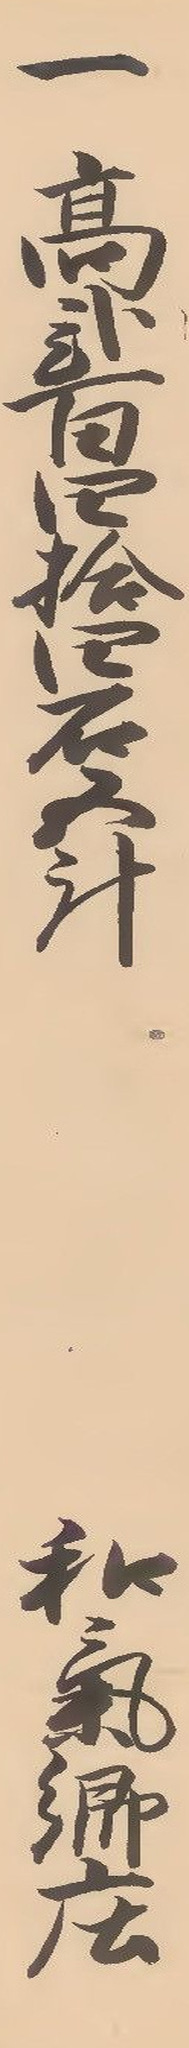一高弐百四拾四石五斗和気郷庄

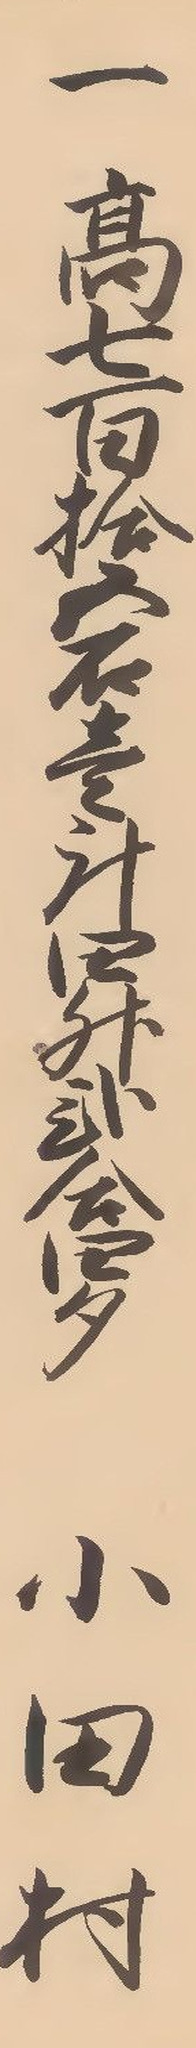一高七百拾五石壱斗四升弐合四勺小田村
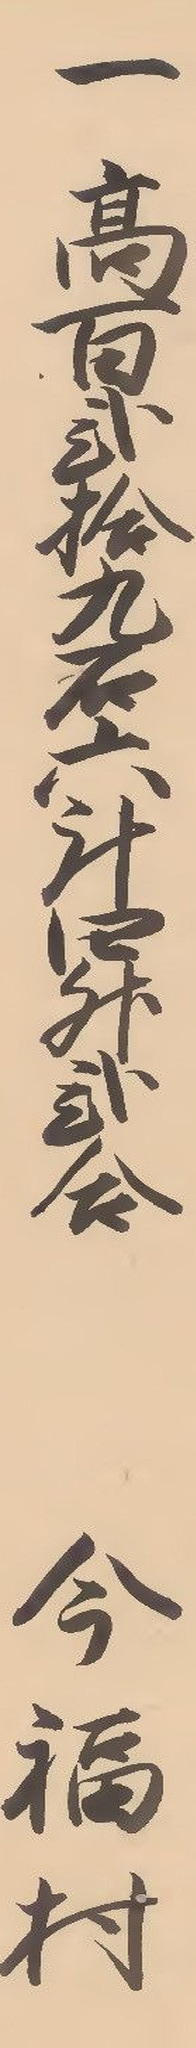一高百弐拾九石六斗四升弐合今福村
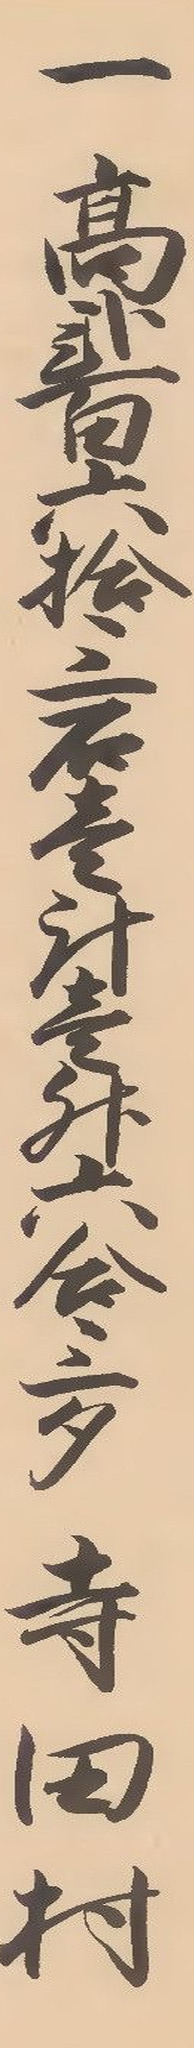一高弐百六拾三石壱斗壱升六合三勺寺田村
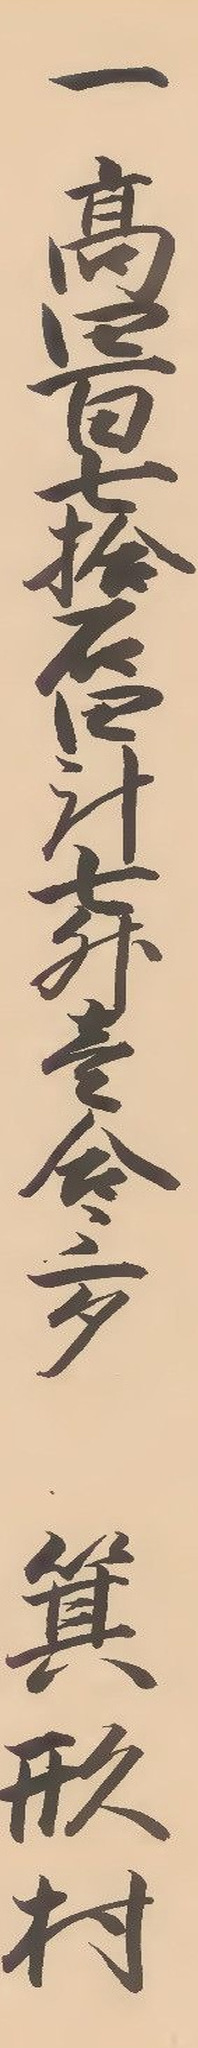一高四百七拾石四斗七升壱合三勺箕形村
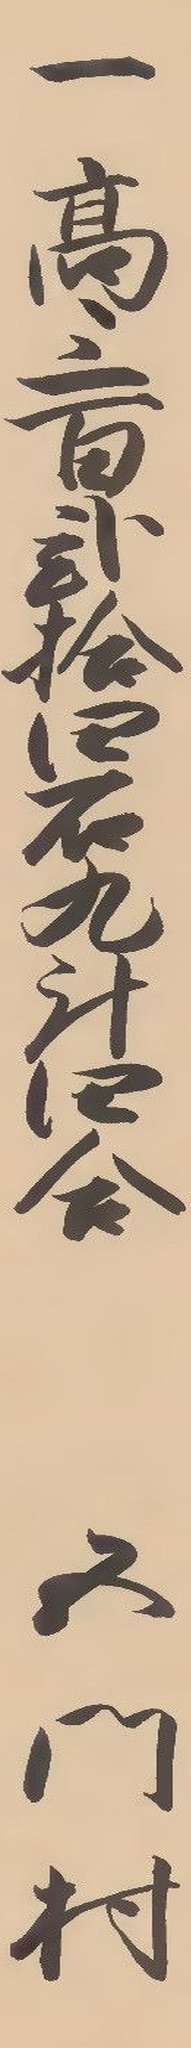一高三百弐拾四石九斗四合五門村
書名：和泉国郷帳
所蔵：国立公文書館 National Archives of Japan
